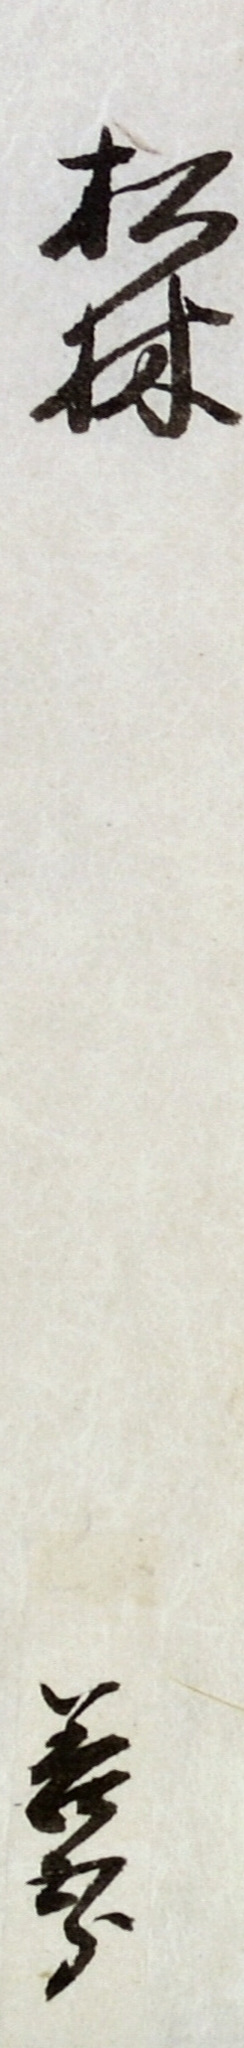松林善五郎
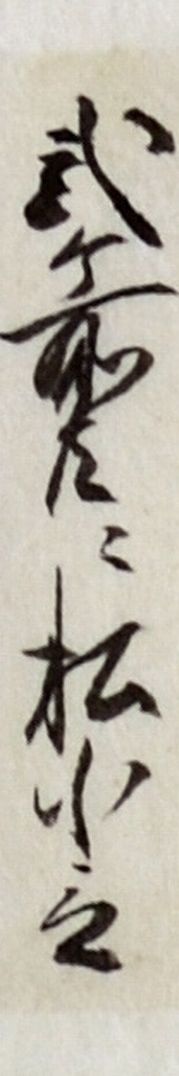弐ケ所共ニ松小立

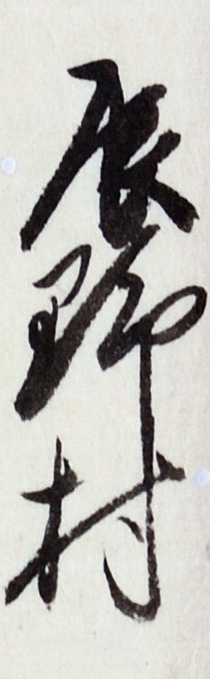辰野村
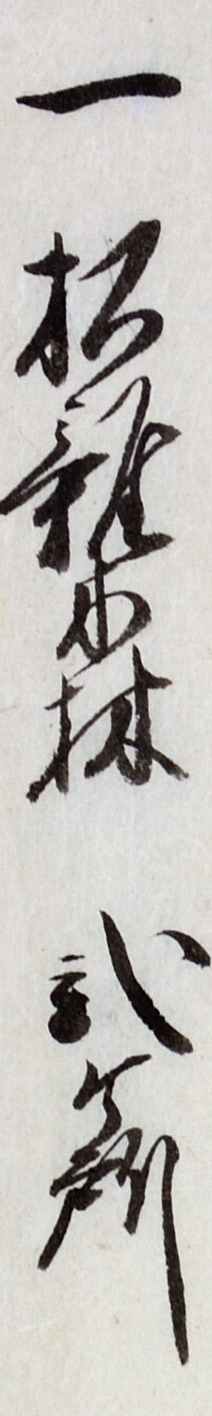一松雑木林弐ケ所
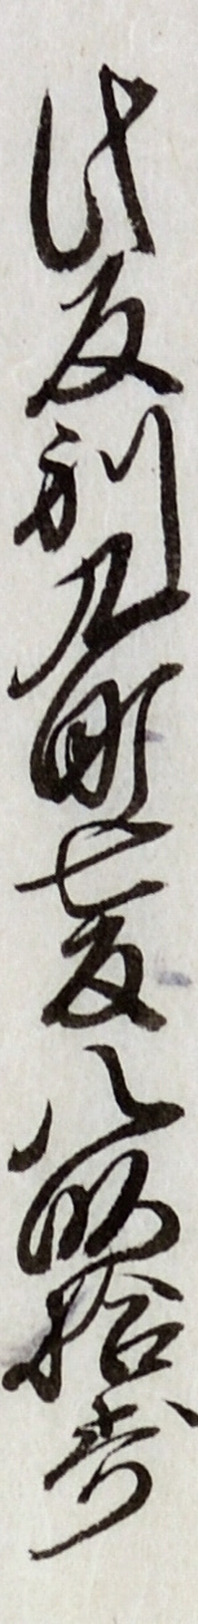此反別九町七反八畝拾歩
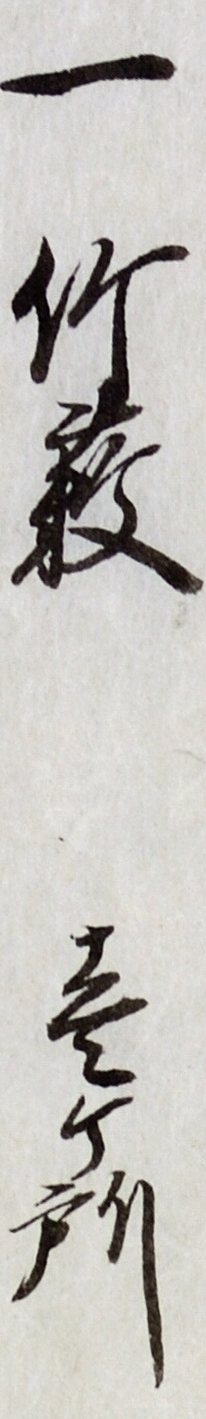一竹藪壱ケ所
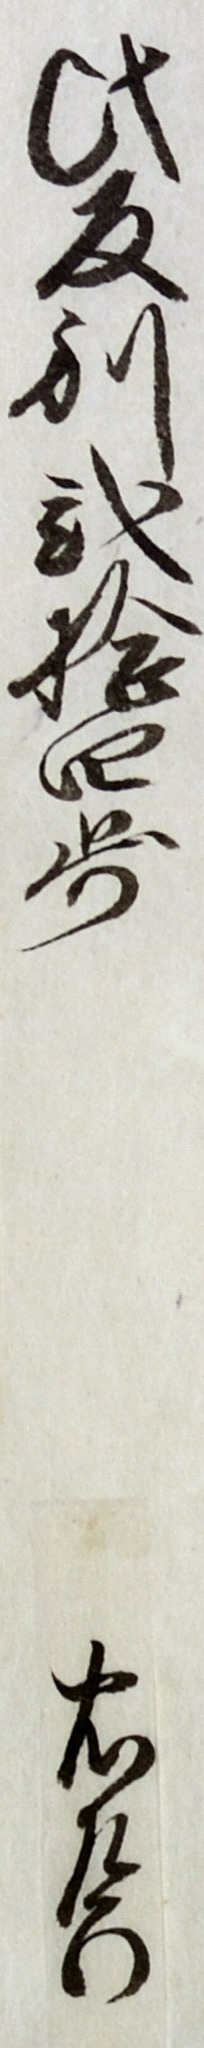此反別弐拾四歩忠左衛門

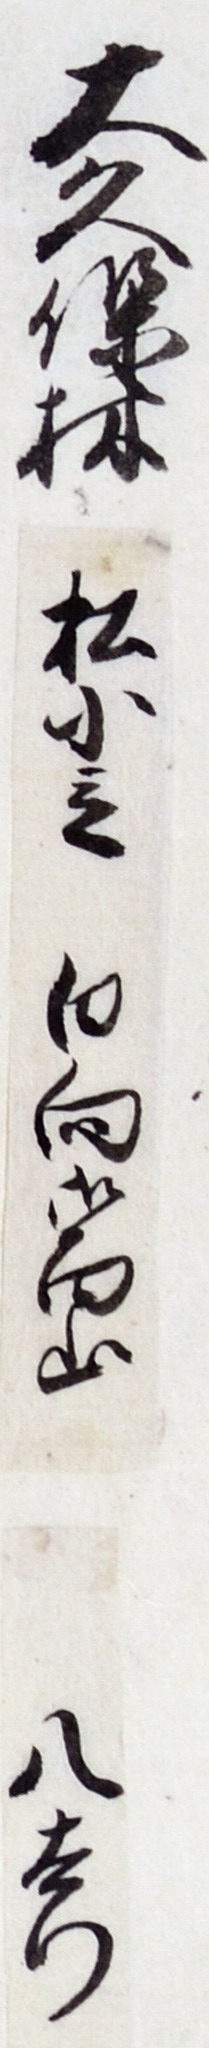大久保林松小立日向御留山八右衛門
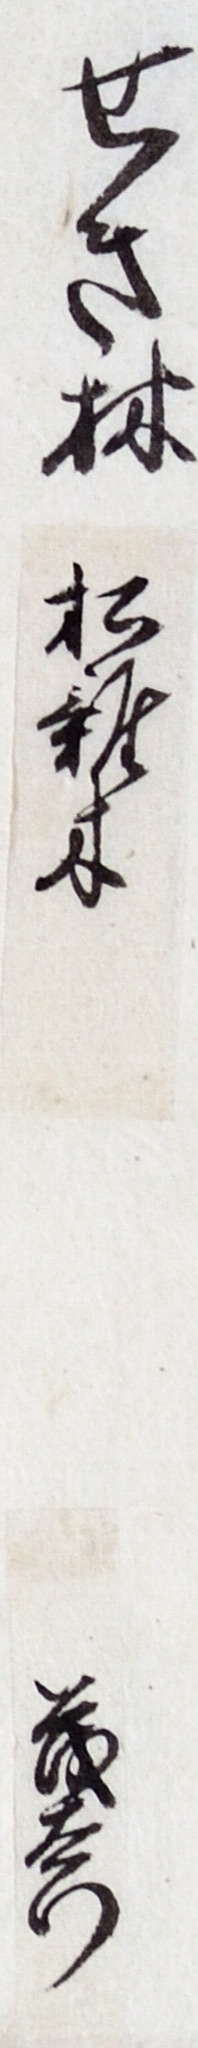せき林松雑木茂右衛門
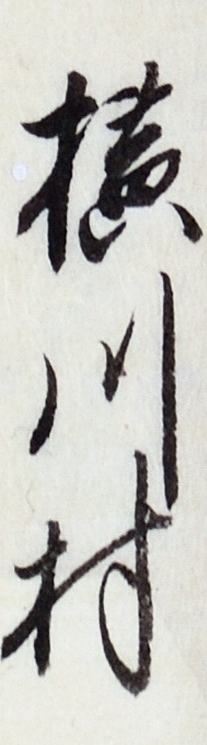横川村
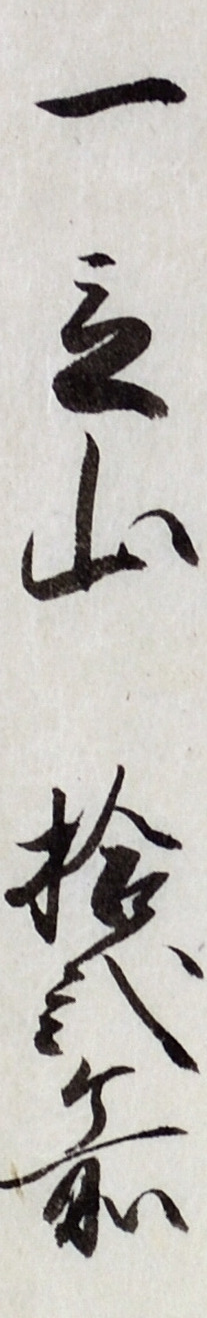一立山拾弐ケ所

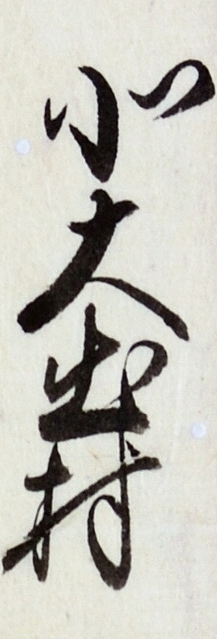北大出村
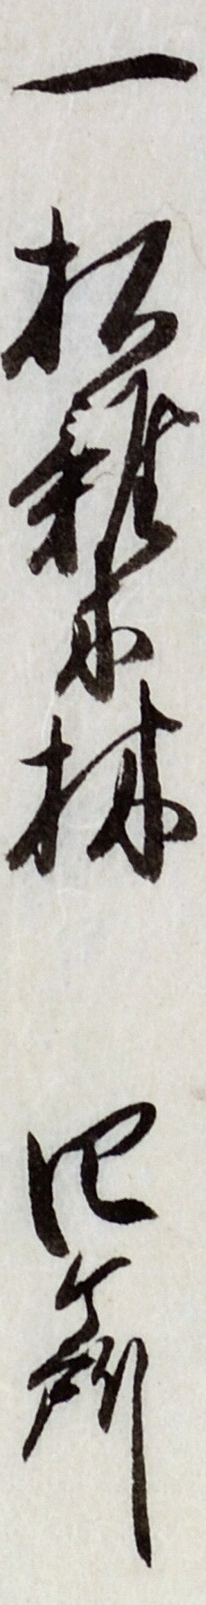一松雑木林四ケ所
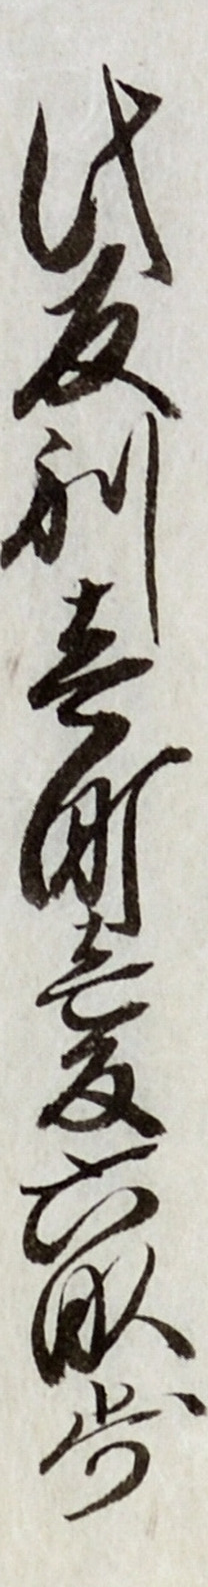此反別壱町壱反六畝歩
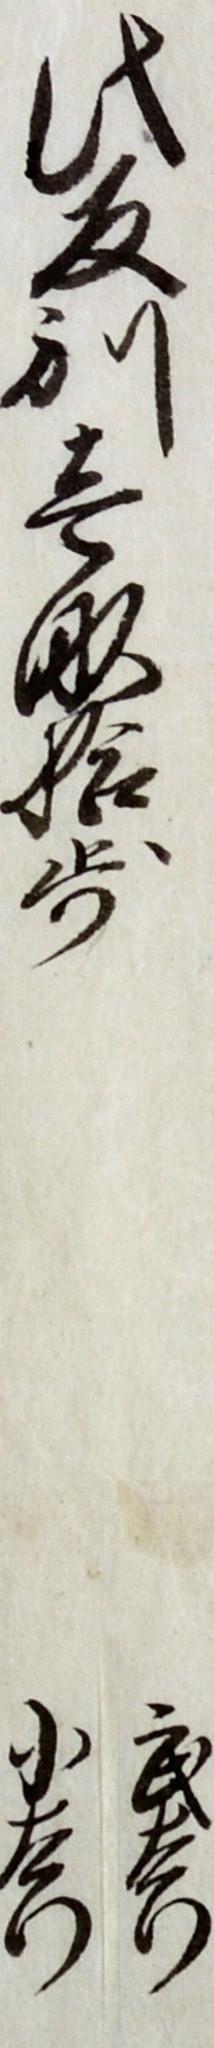此反別壱畝拾歩武右衛門
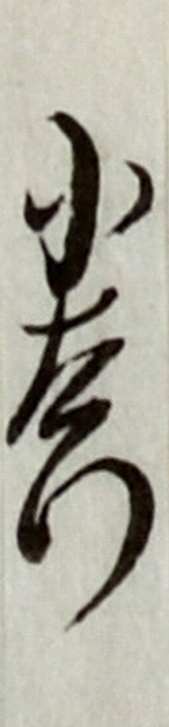小右衛門
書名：御領分中御林御藪附帳
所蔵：伊那市立高遠町図書館・合同会社AMANE
